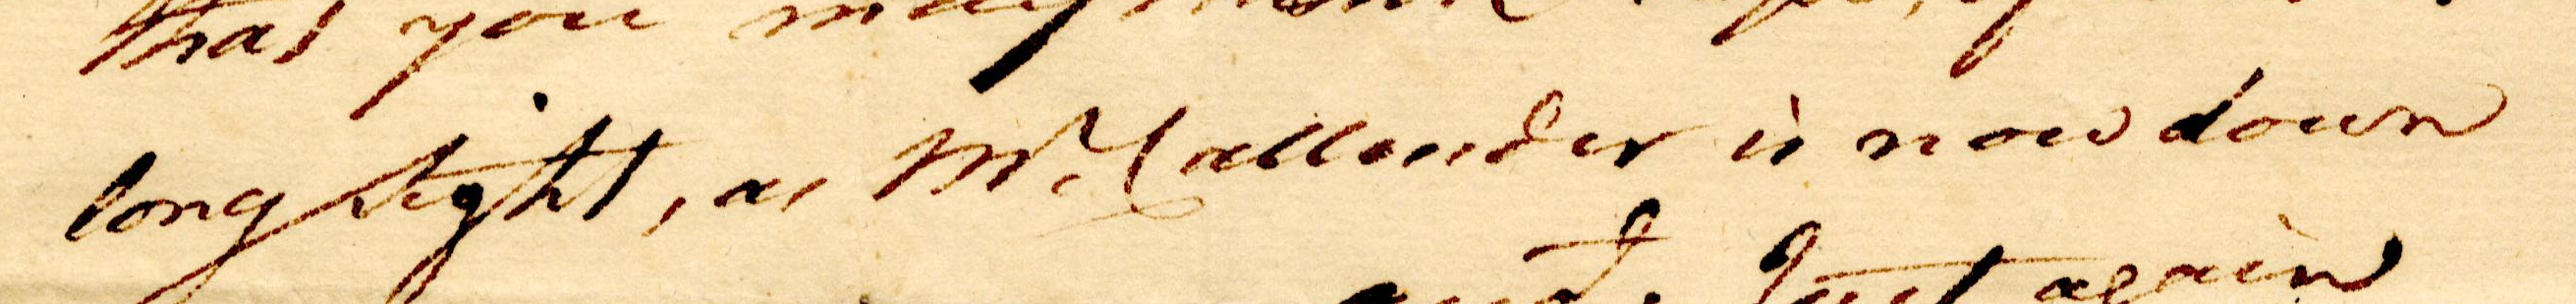long Sight, as M^r Callender is now down
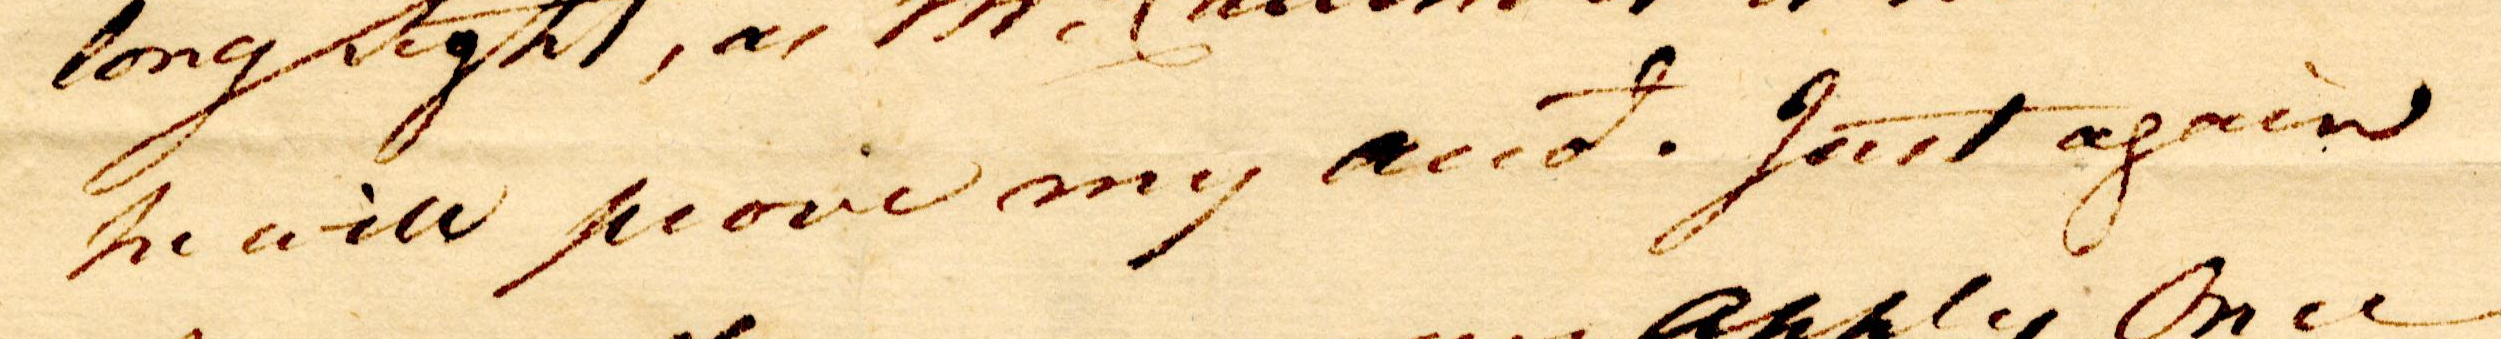he will prove my acco^t. Just again
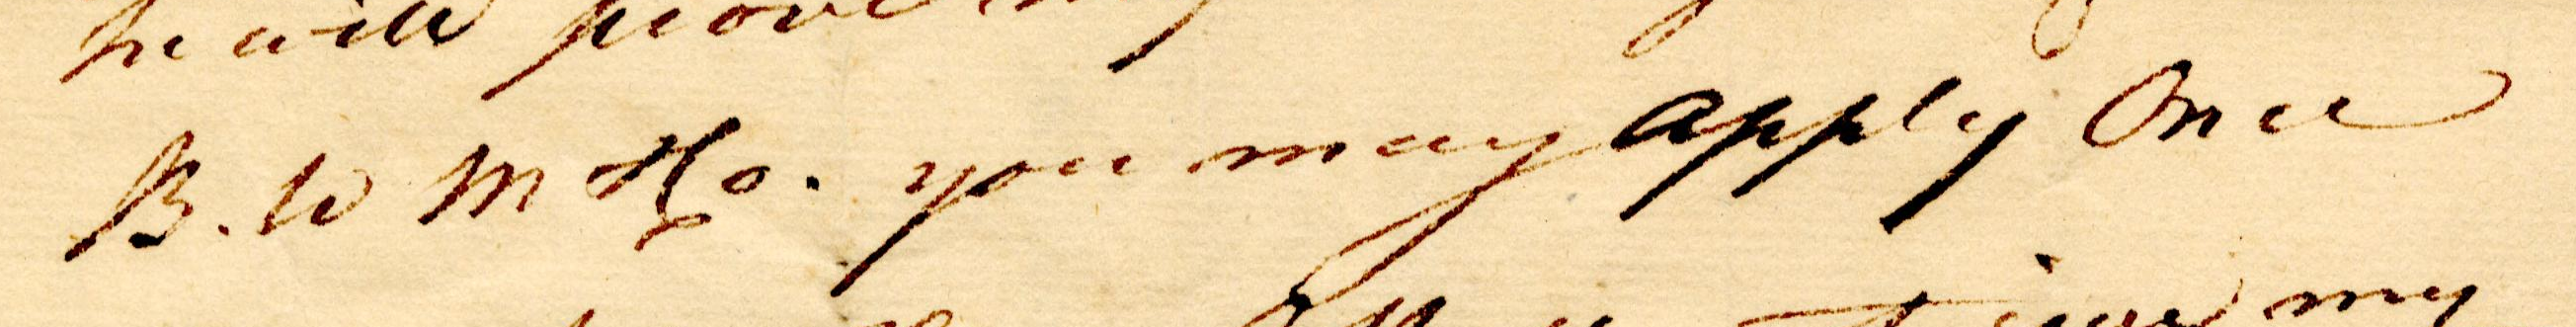B. W M &Co. you may apply once
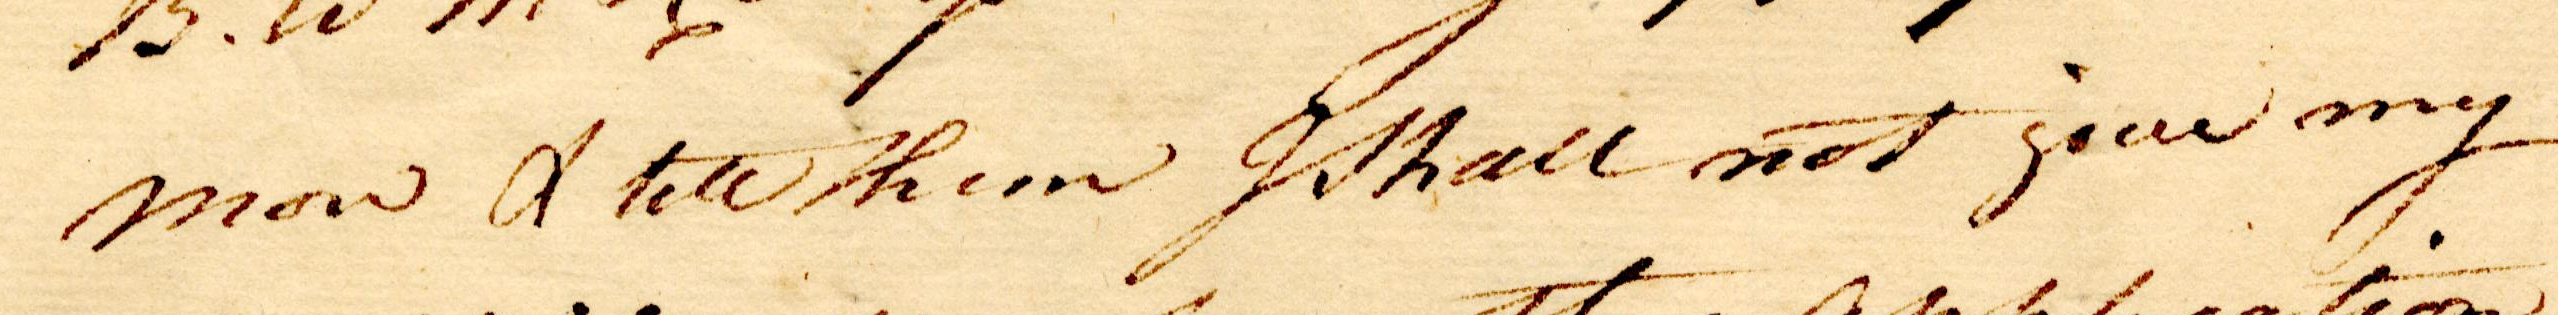more & tell them I shall not give my
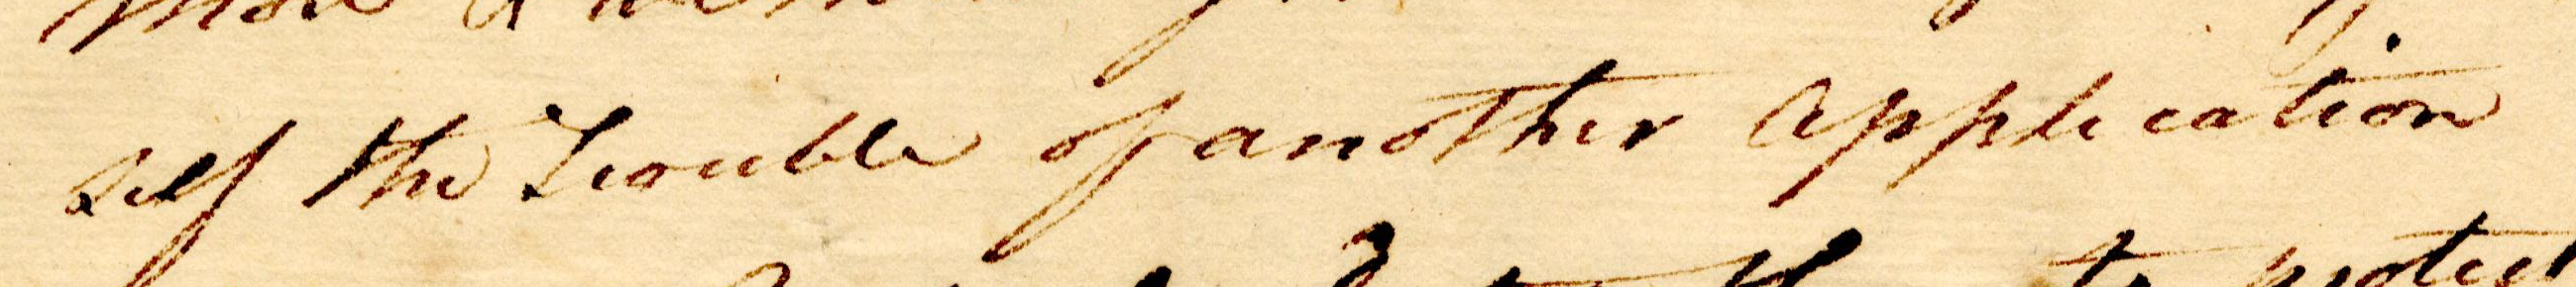self the trouble of another application
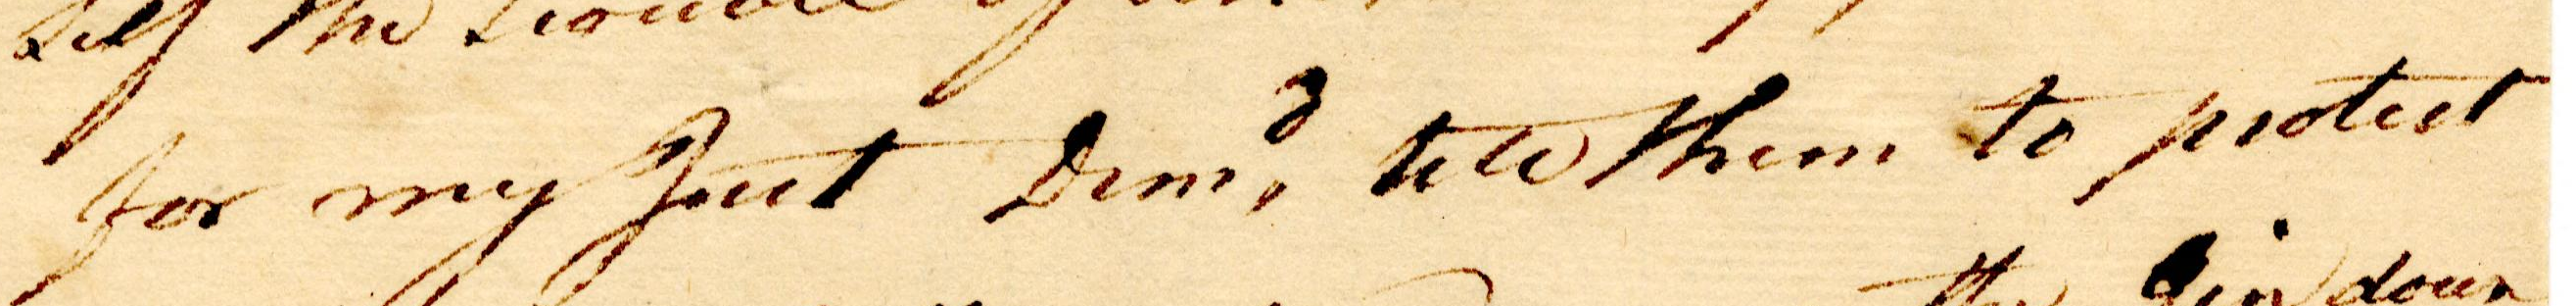for my Just Dem^d. tell them to protest
